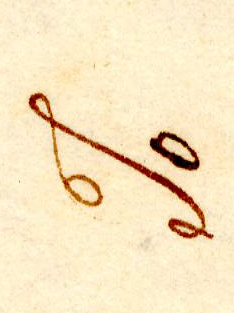To
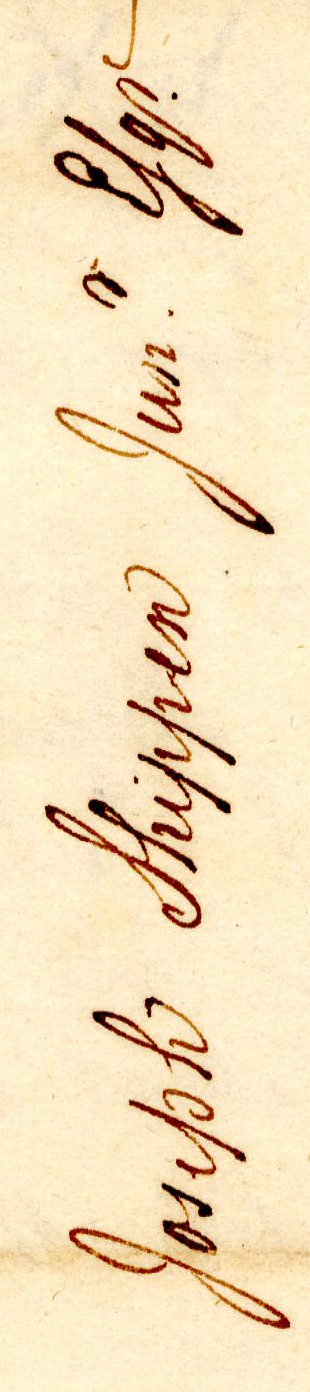Joseph Shippen Jun^r. Esq^r.
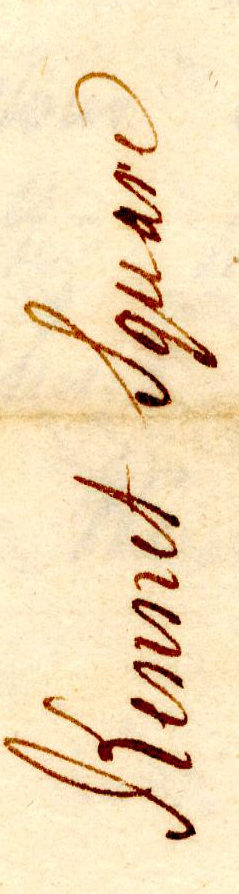Kennet Square
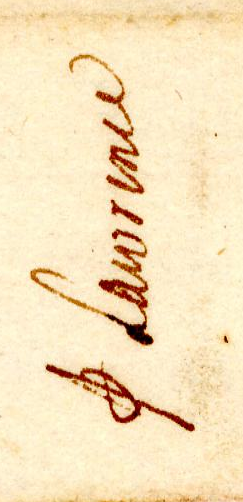per Lawrence
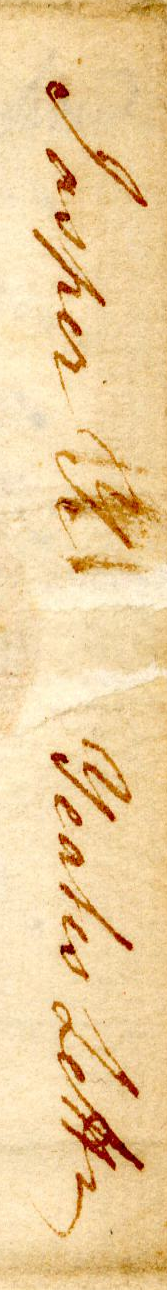Jasper Ye Yeates Letter
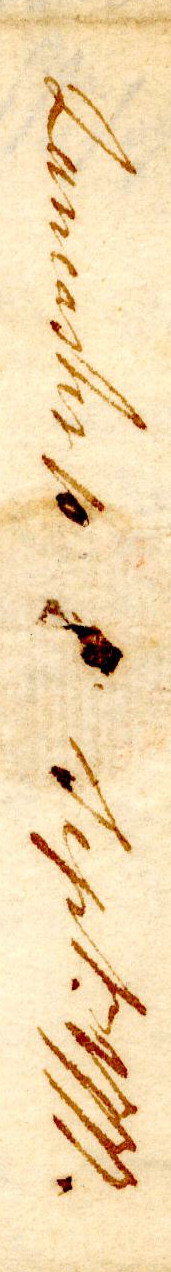Lancaster 10 Sept. 1777.
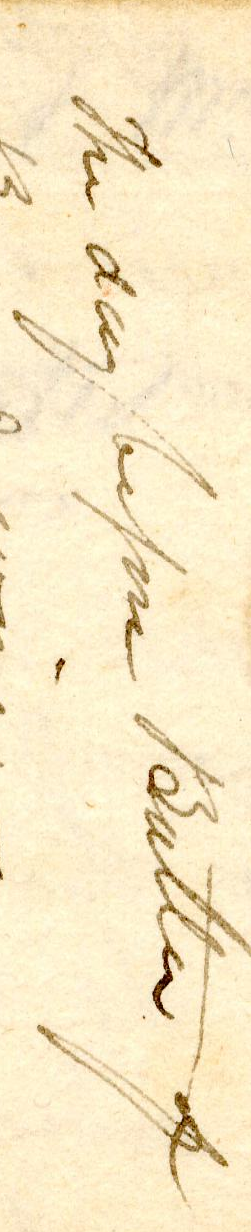The day before Battle of
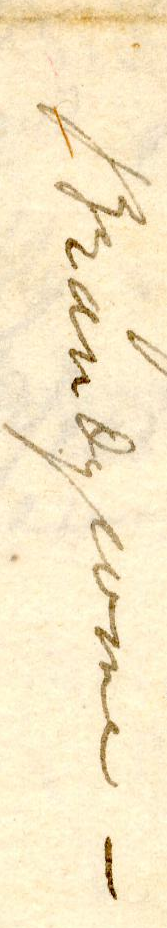Brandywine-
